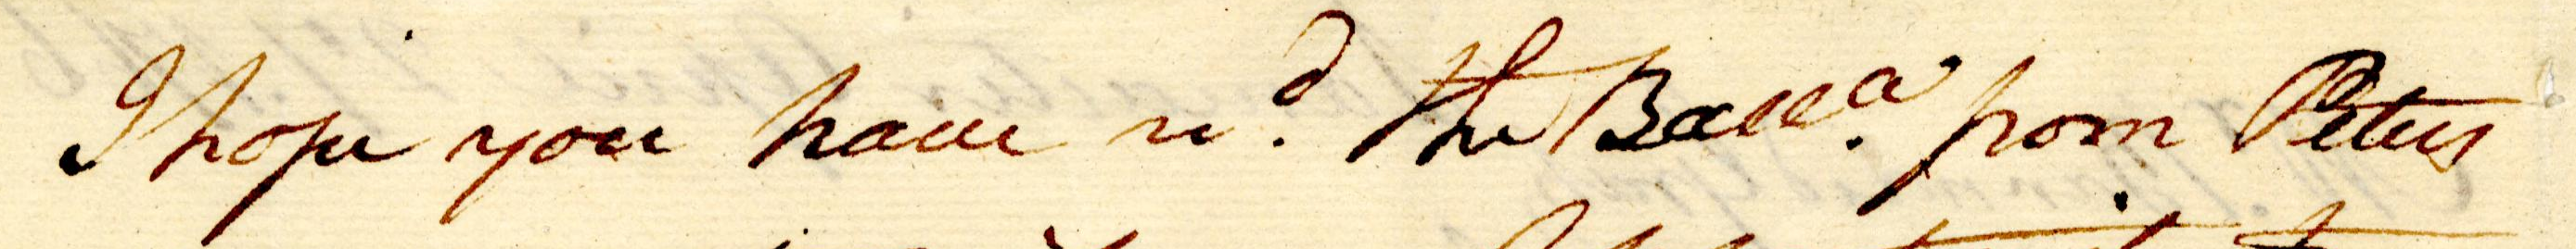I hope you have re^d. the Ball^ce. from Peters
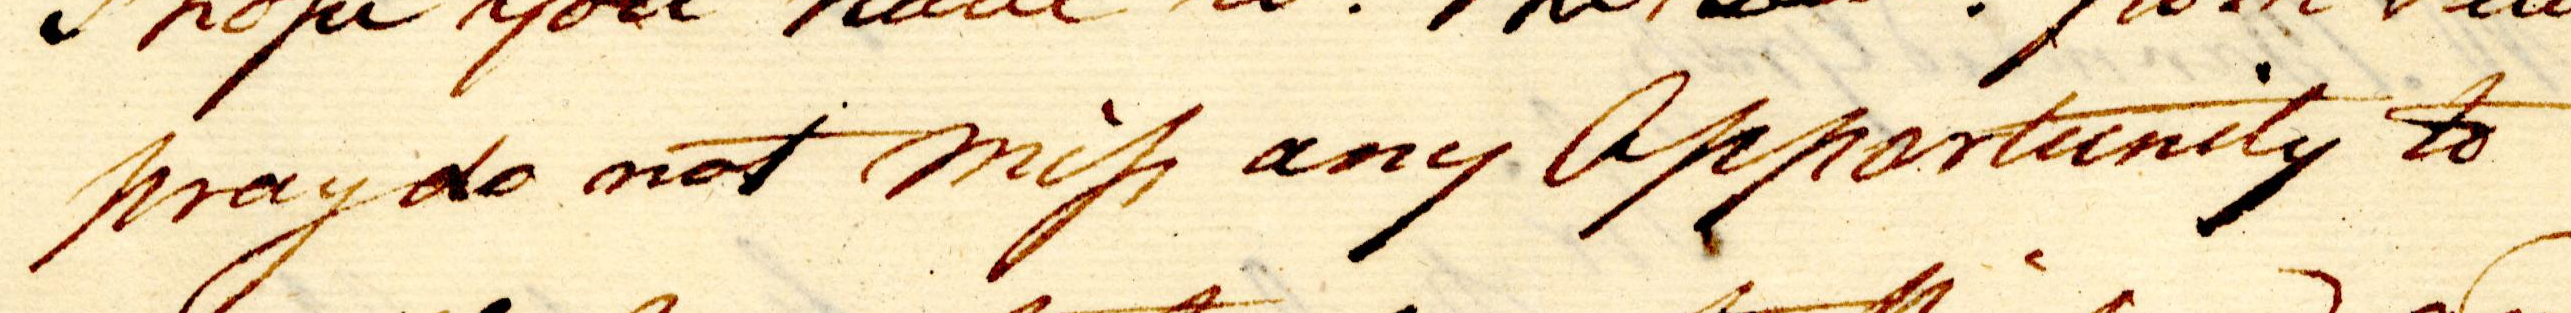pray do not miss any opportunity to
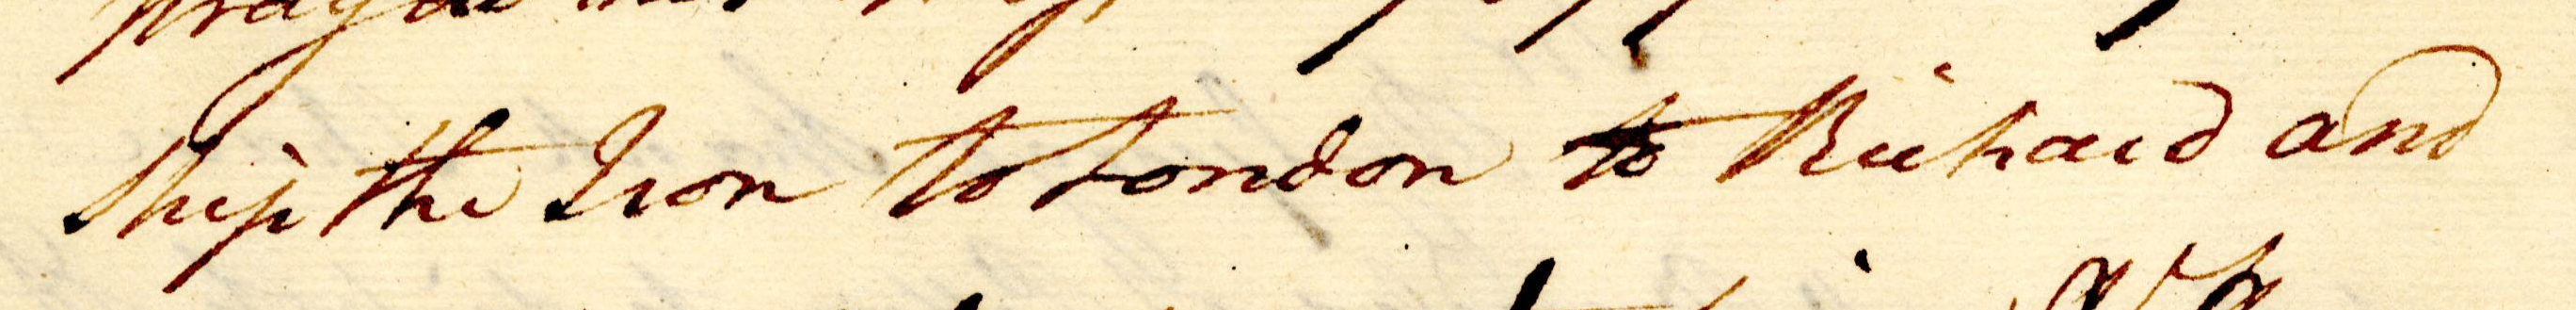ship the Iron to London to Richard and
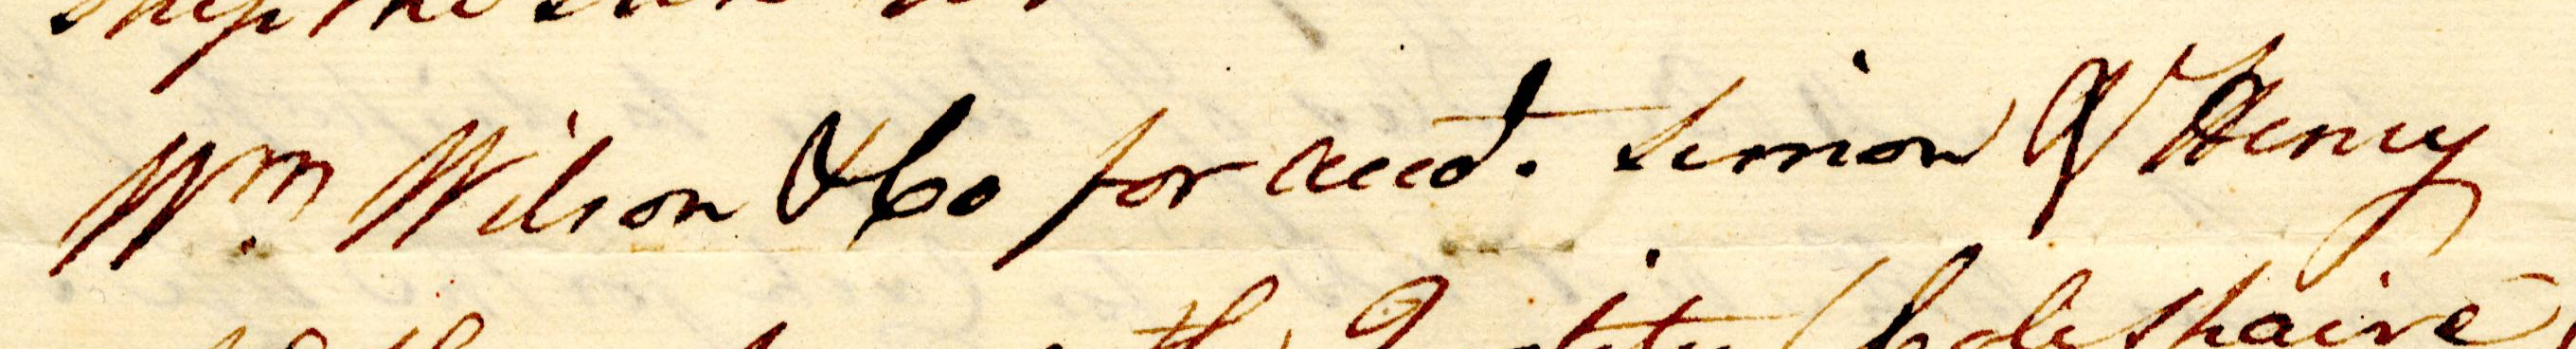W^m Wilson &Co for acco^t. Simon & Henry
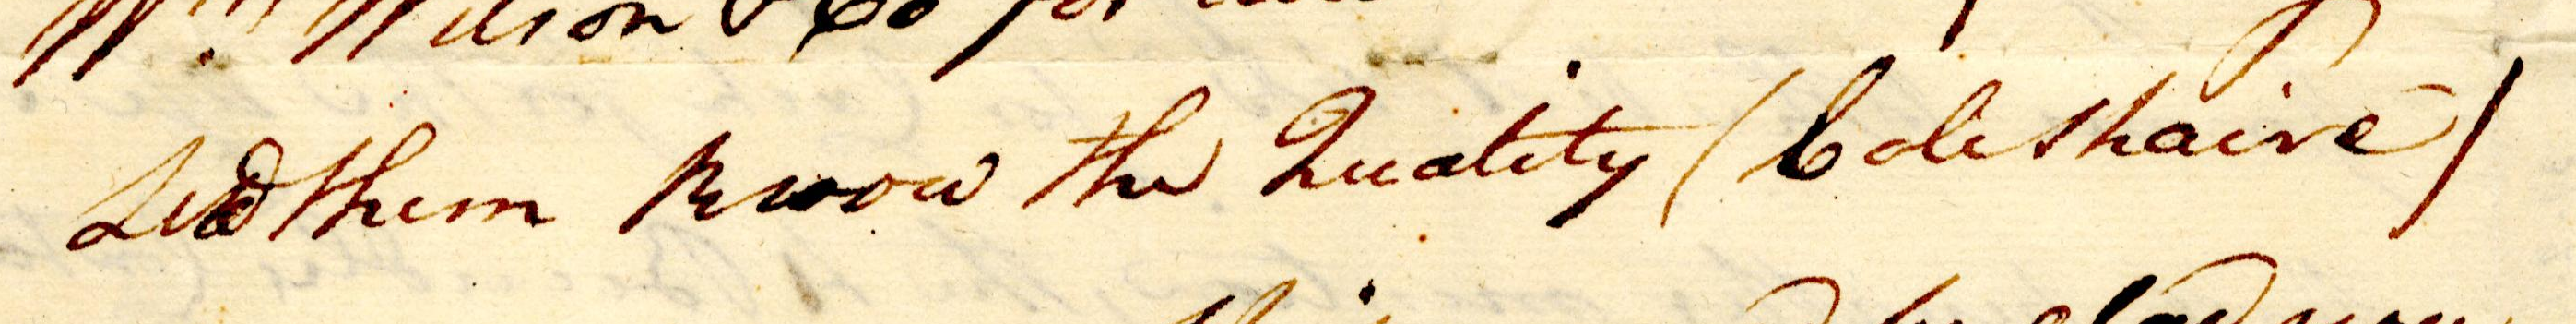Letd them know the Quality (Cale shaire)
